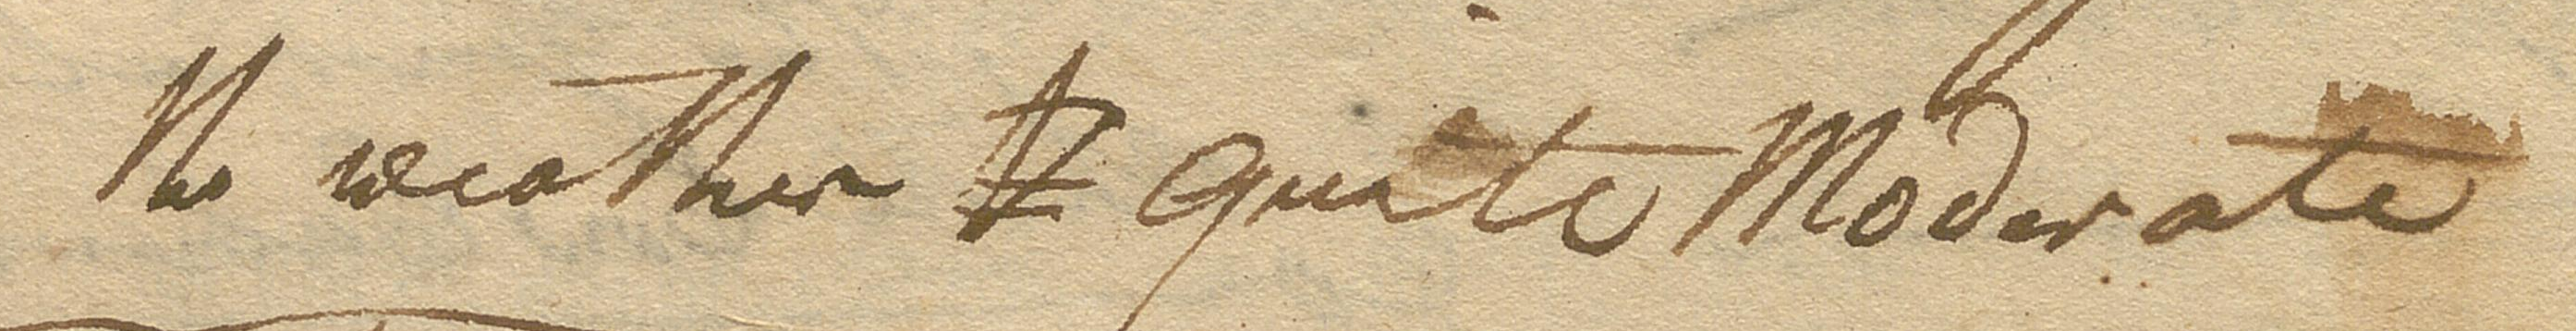the weather [V] quite Moderate
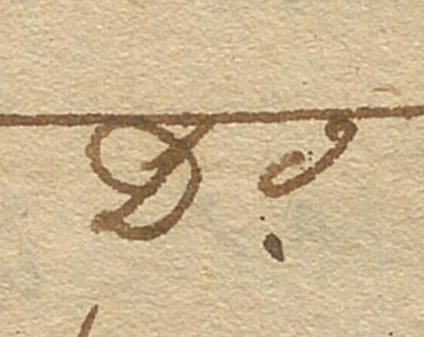D^o.
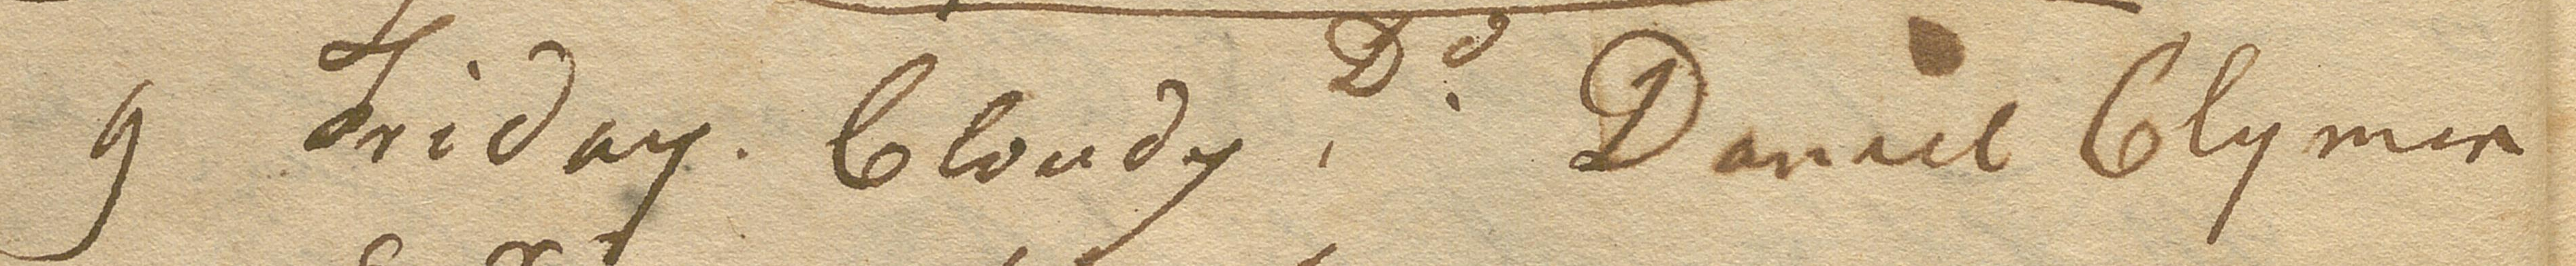9 Friday. Cloudy. Daniel Clymer
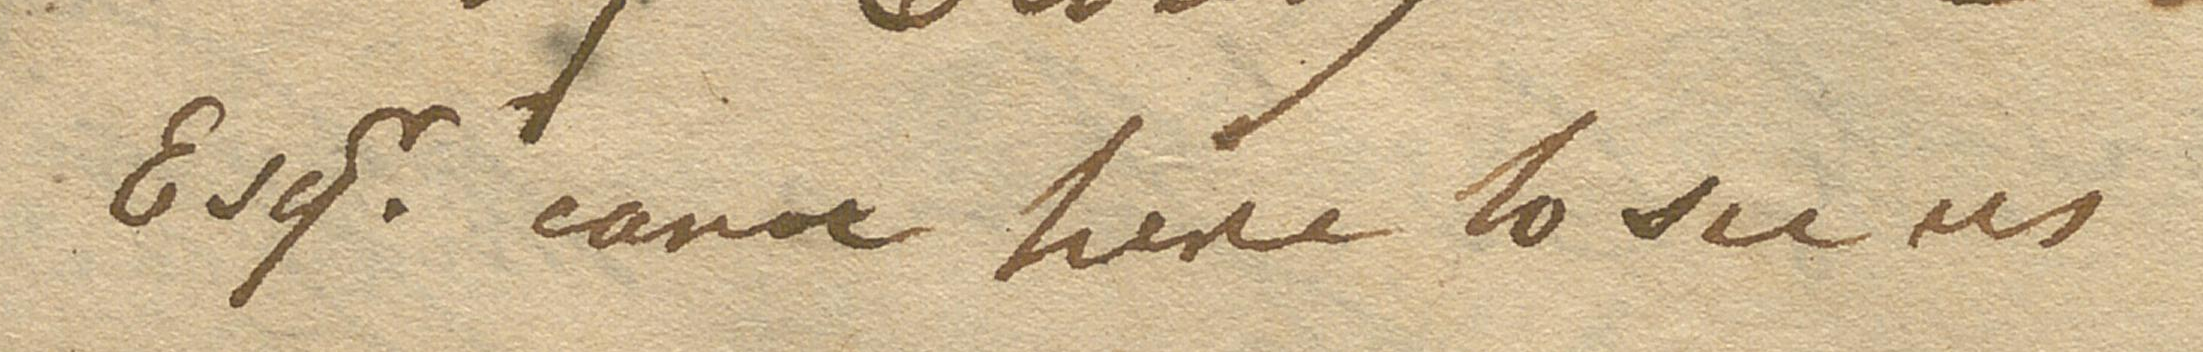Esq^r. came here to see us
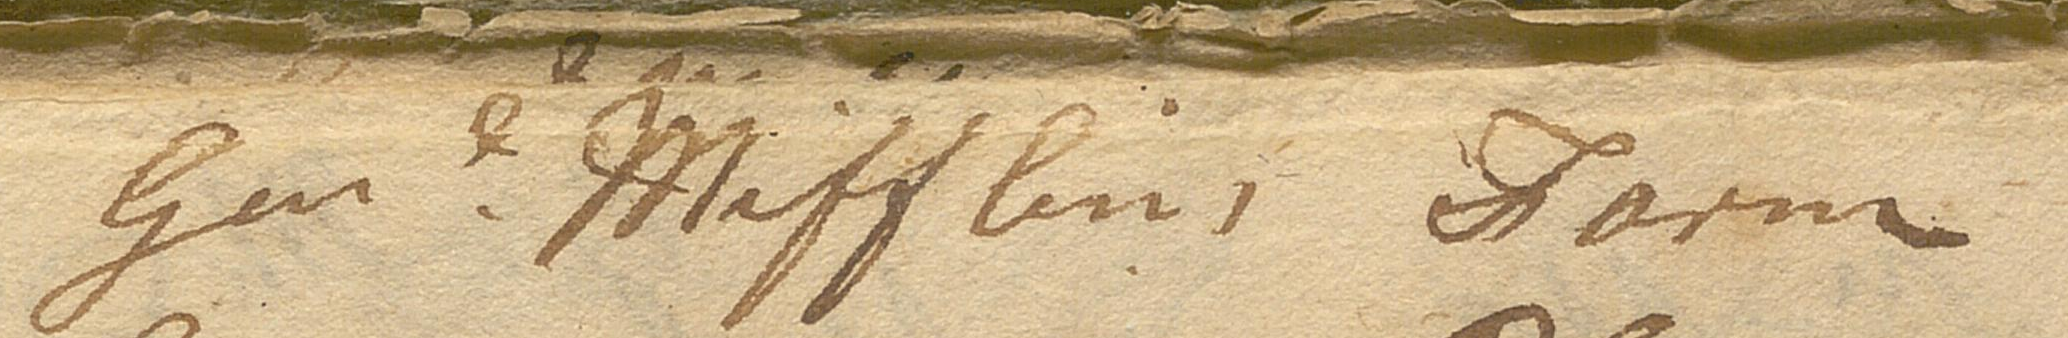Gen^l. Mifflins Farm
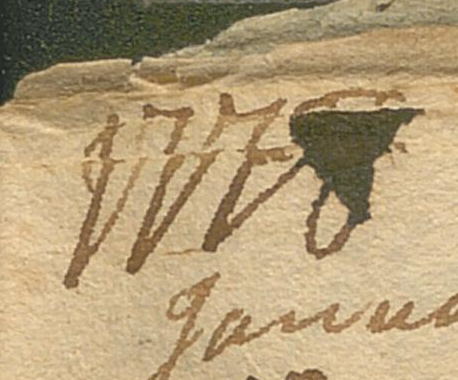1778
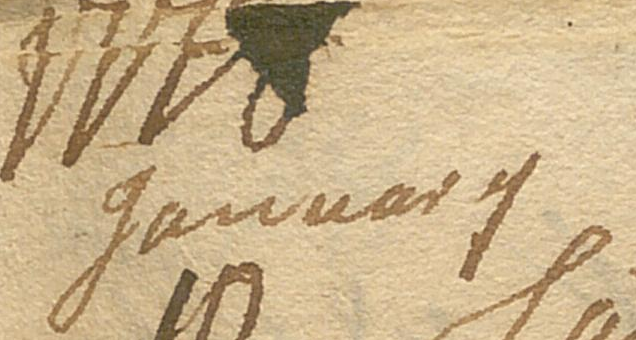January
